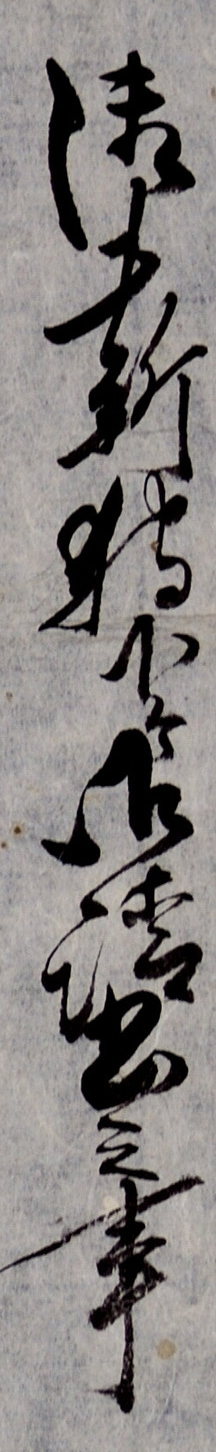御薪狩下ケ御請書之事
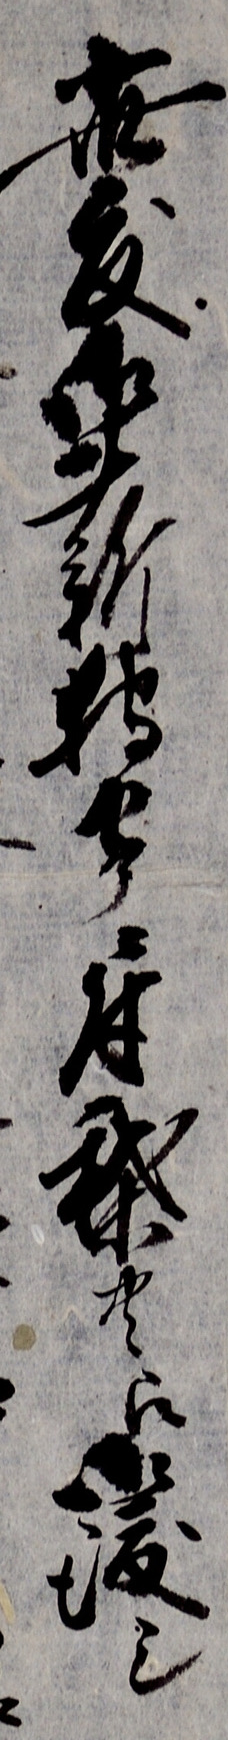此度御薪狩下ケニ付我等共江御渡シ
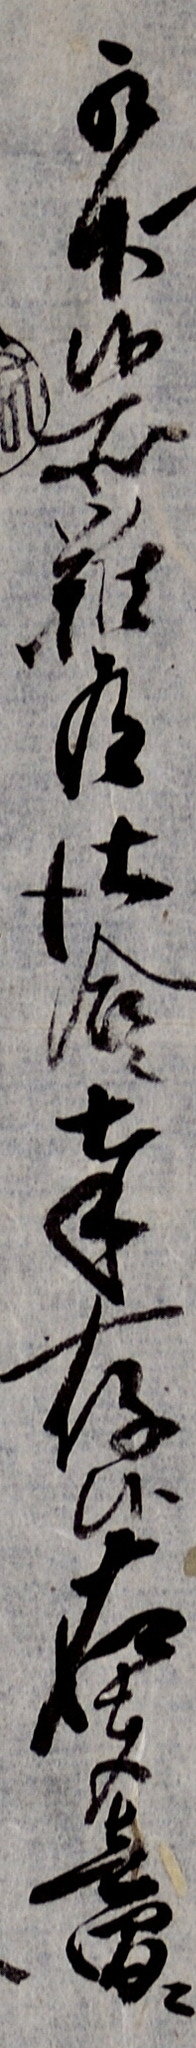被下候所難有仕合ニ奉存候右者壱間ニ
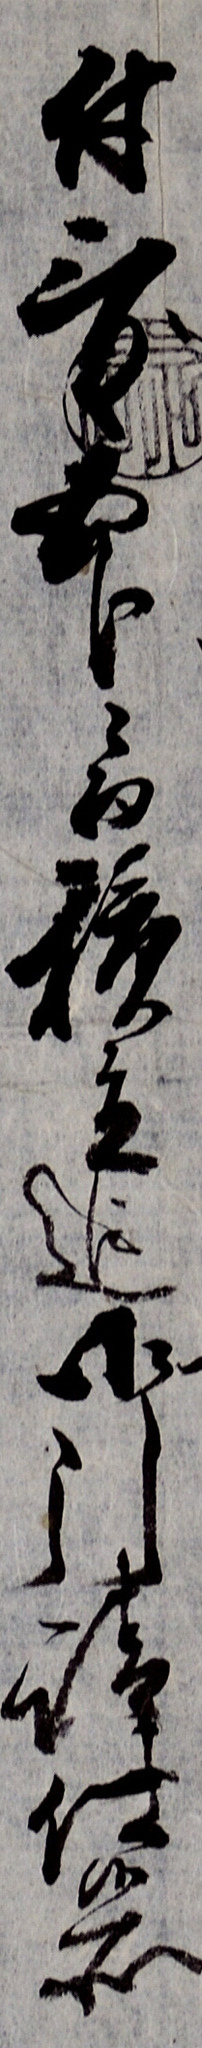付三両五分ニ而積立迄御引請仕候所
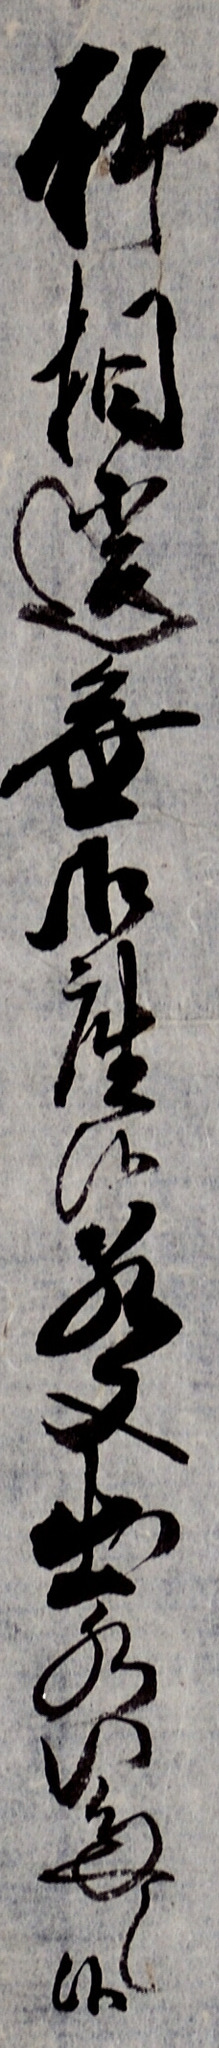聊相違無御座候若又出水いたし候
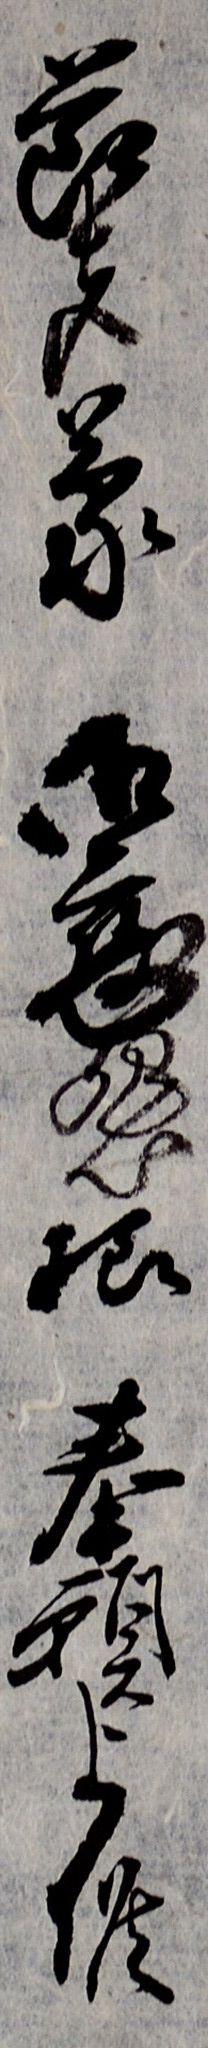節者蒙御慈悲様奉願上候
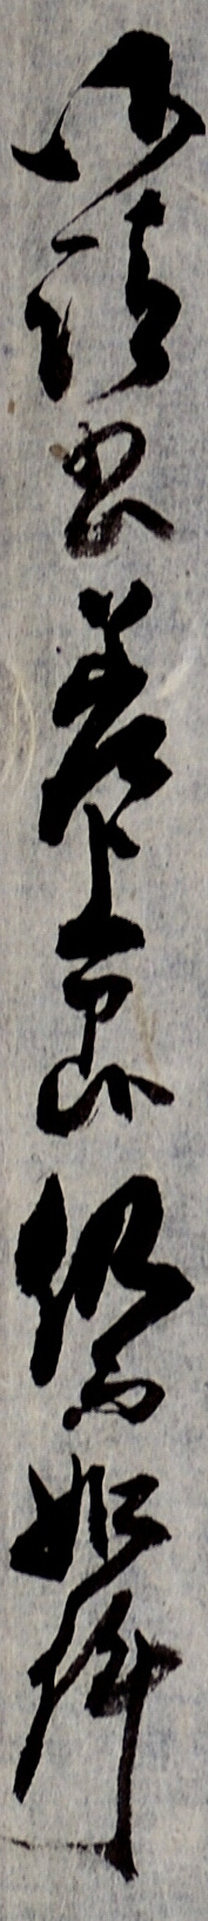御請書差上申候仍而如件
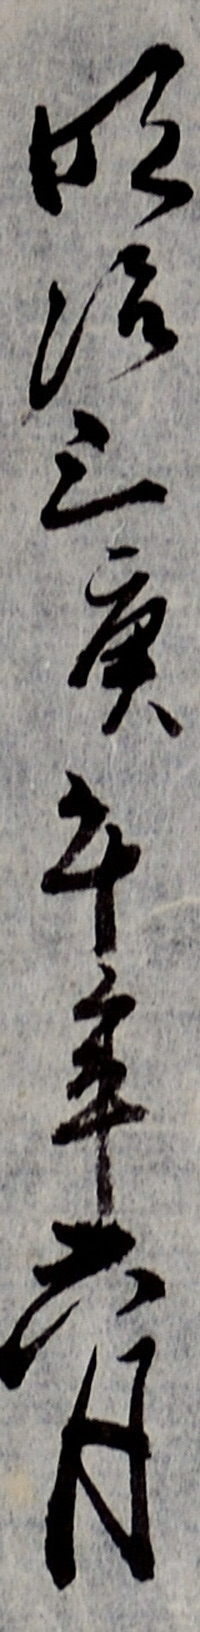明治三庚午年六月
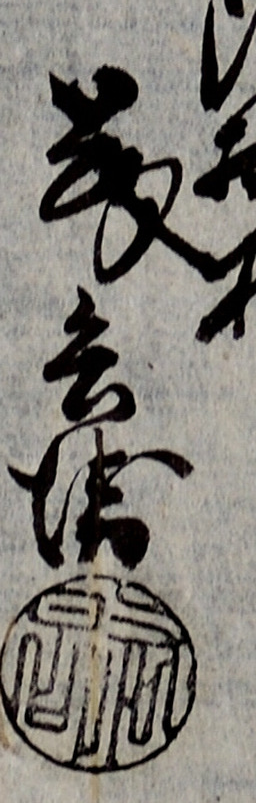茂兵衛㊞
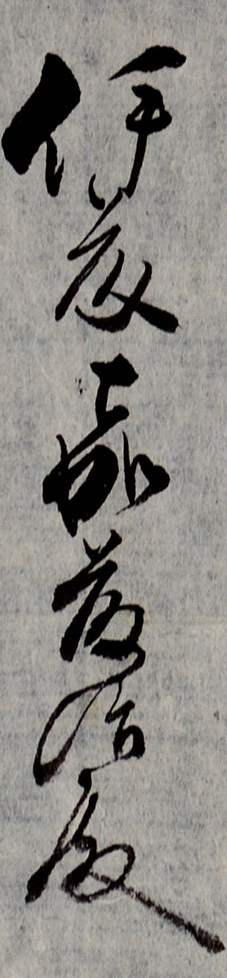伊藤嘉藤治殿
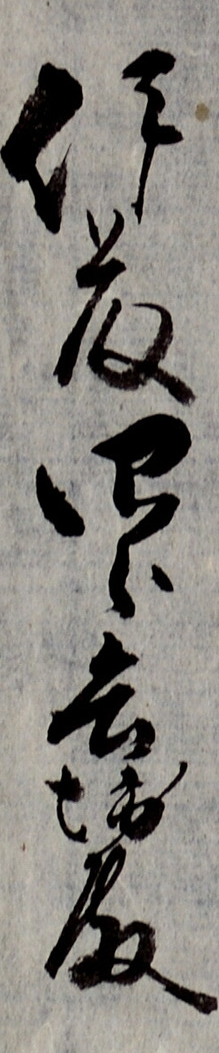伊藤四郎兵衛殿
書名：御薪狩下ゲ御請書
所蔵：伊那市立高遠町図書館・合同会社AMANE
